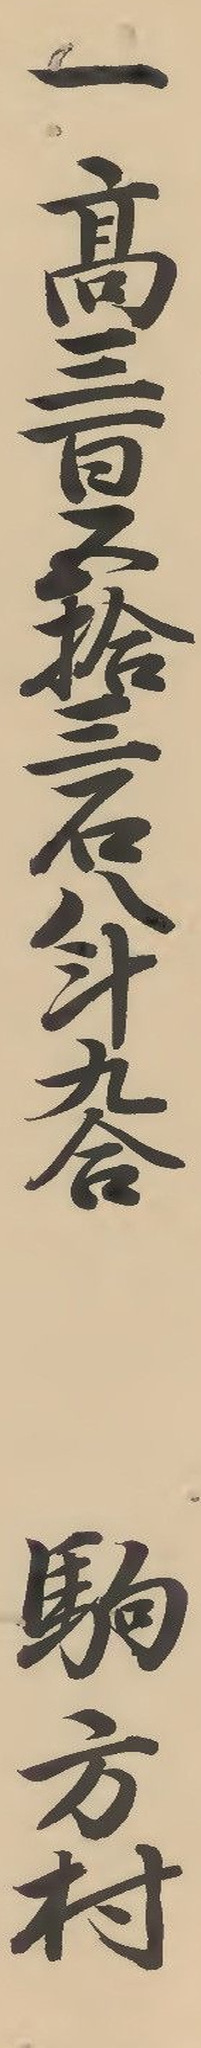一高三百五拾三石八斗九合駒方村
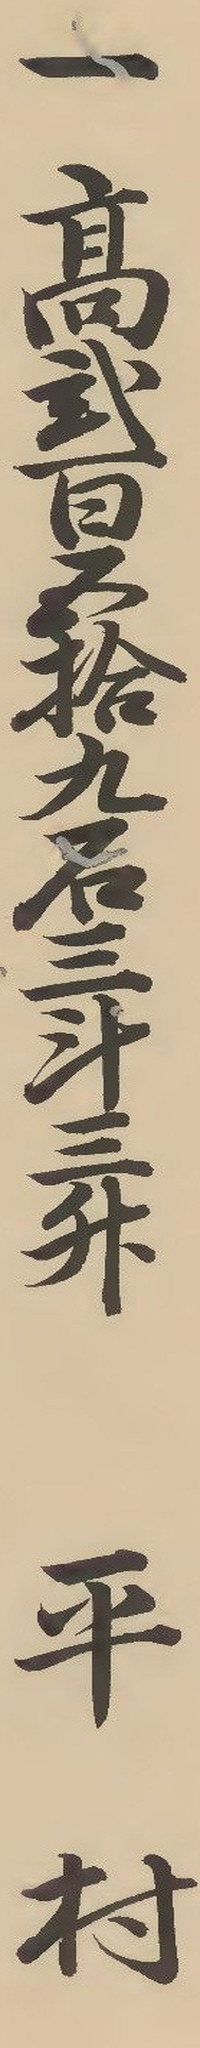一高弐百五拾九石三斗三升平村
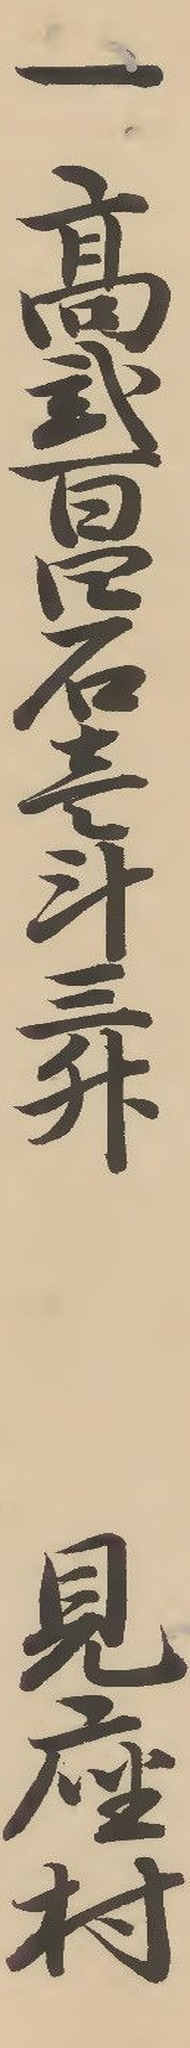一高弐百四石壱斗三升見座村
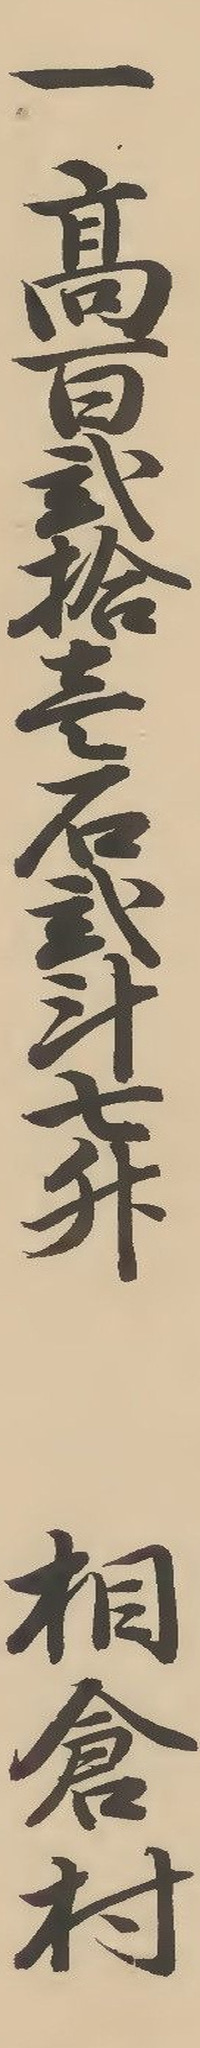一高百弐拾壱石弐斗七升相倉村
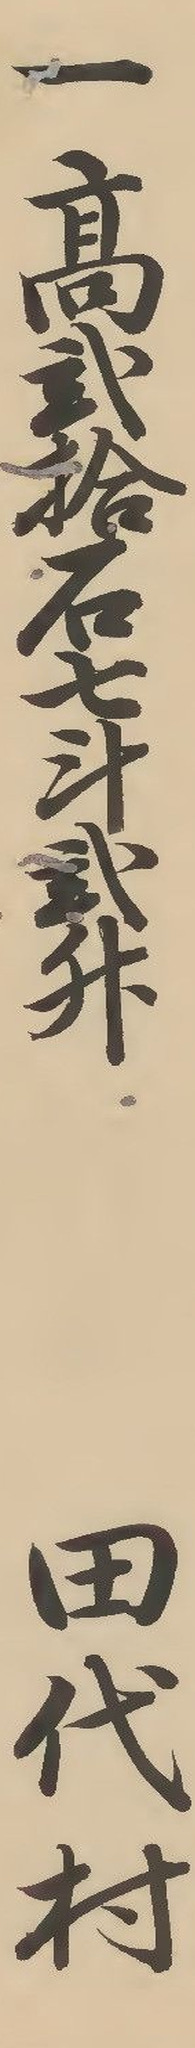一高弐拾石七斗弐升田代村

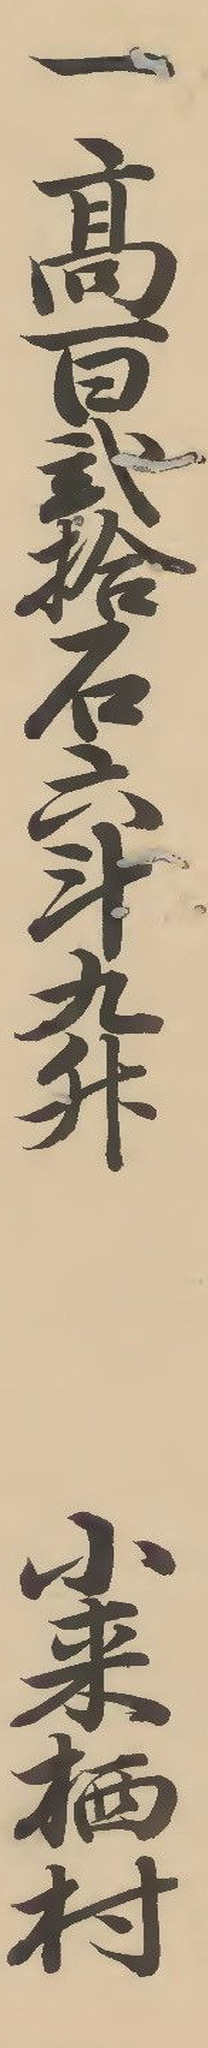一高百弐拾石六斗九升小来栖村
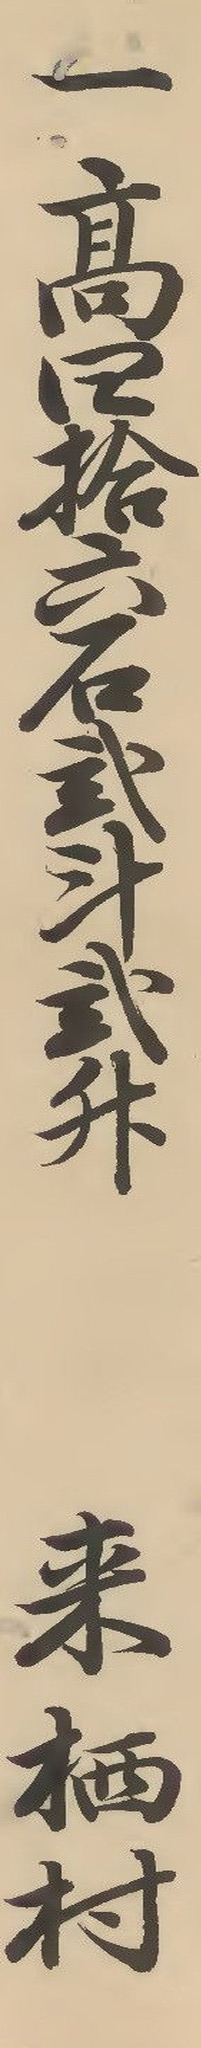一高四拾六石弐斗弐升来栖村
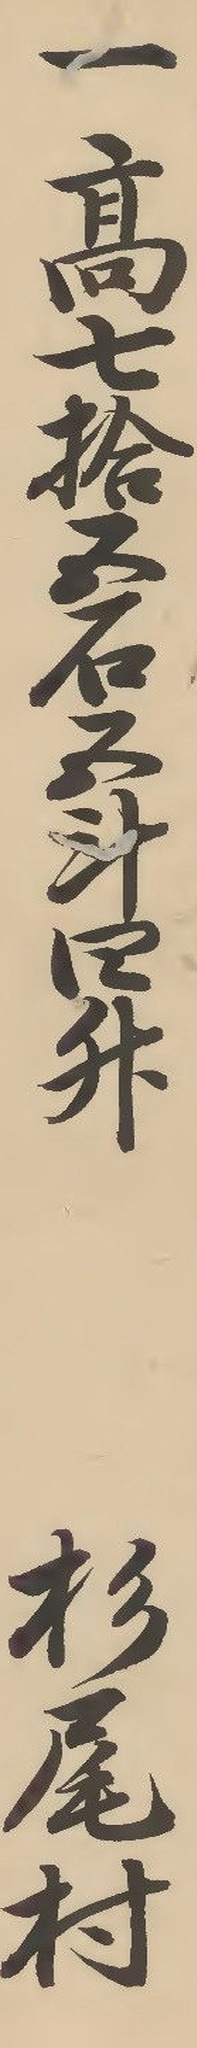一高七拾五石五斗四升杉尾村
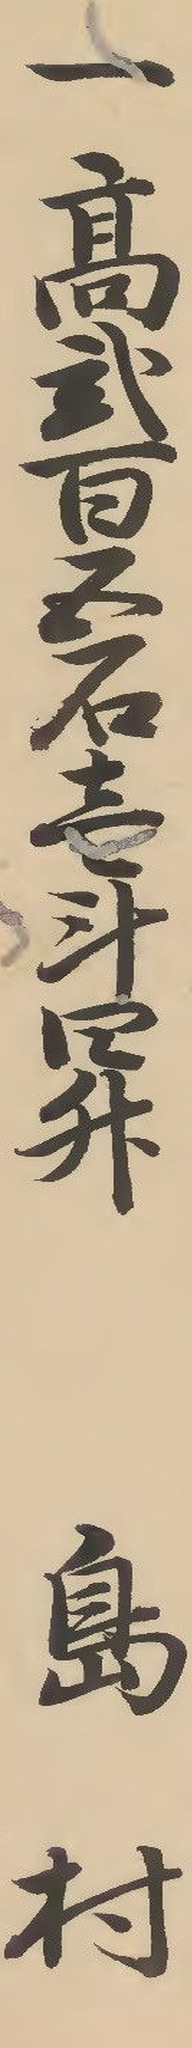一高弐百五石壱斗四升島村
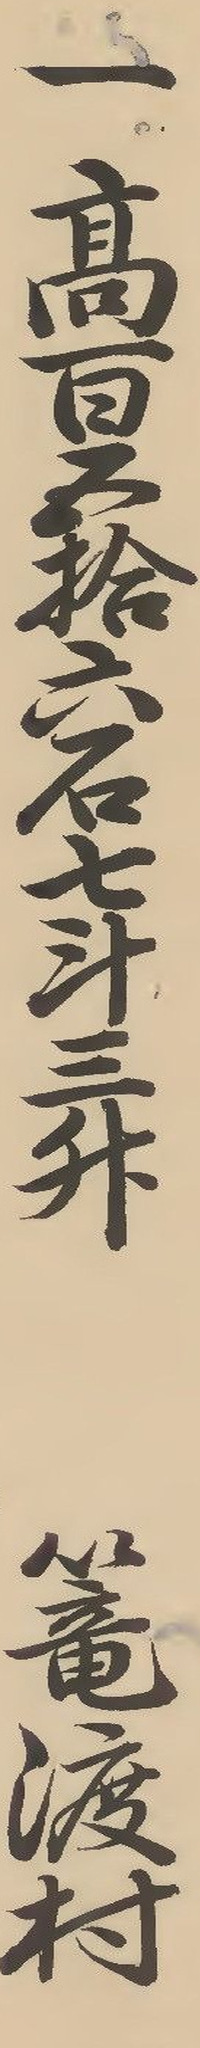一高百五拾六石七斗三升篭渡村
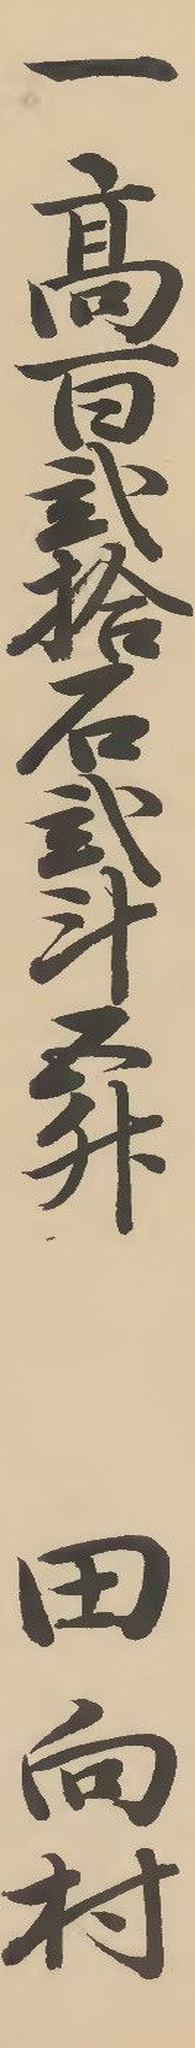一高百弐拾石弐斗五升田向村
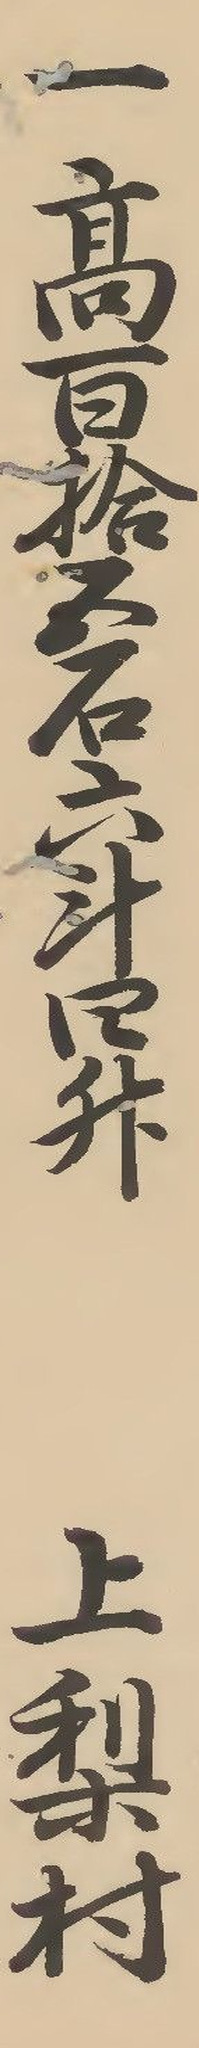一高百拾五石六斗四升上梨村

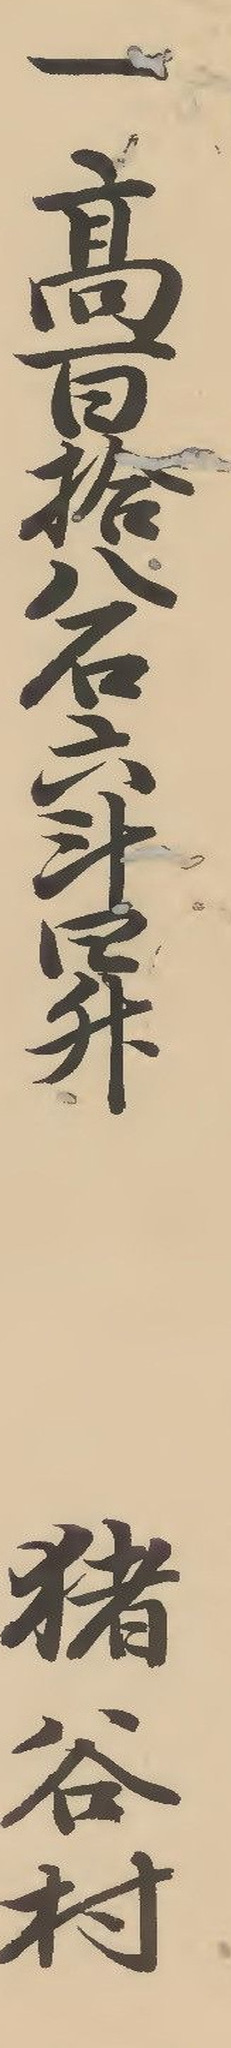一高百拾八石六斗四升猪谷村
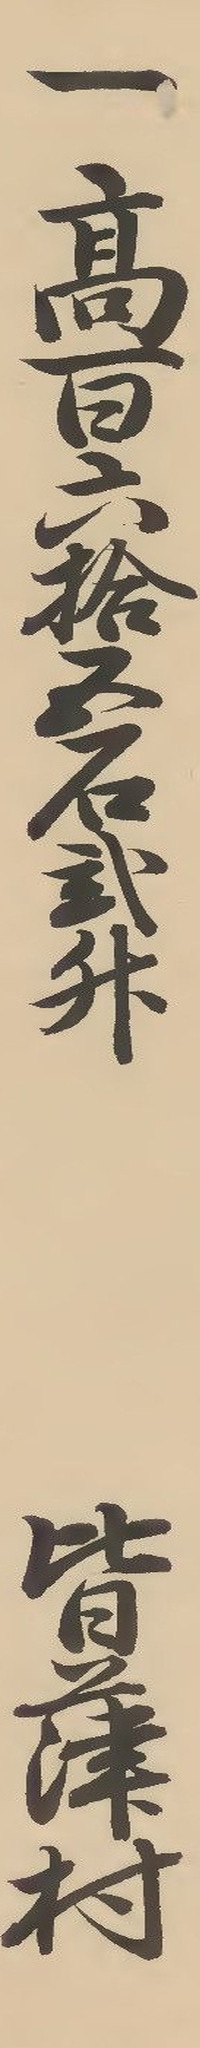一高百六拾五石弐升皆葎村
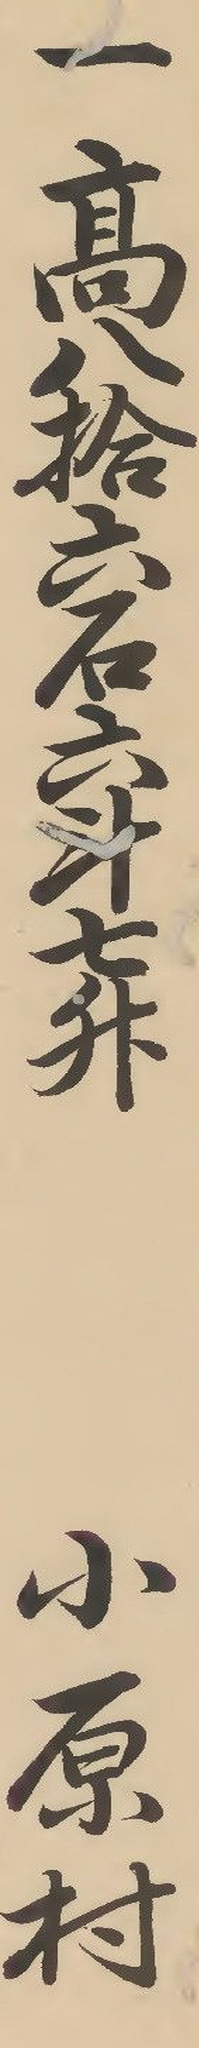一高八拾六石六斗七升小原村
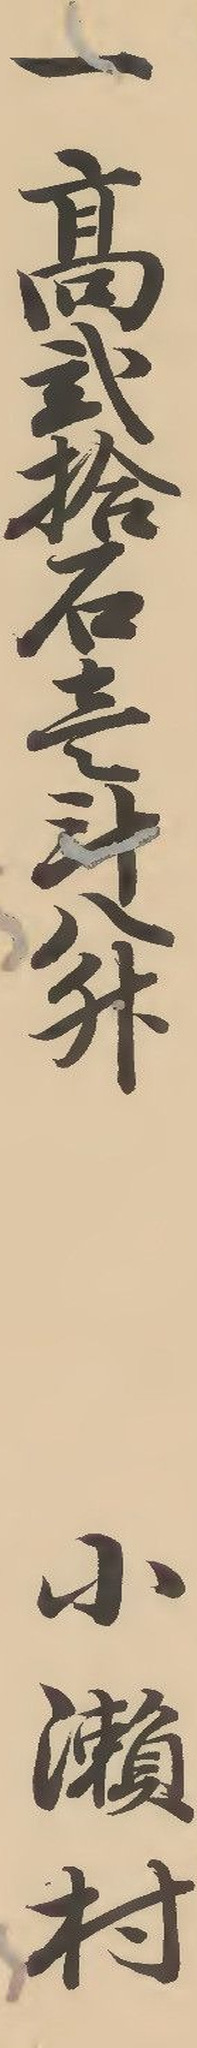一高弐拾石壱斗八升小瀬村
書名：越中国郷帳
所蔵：国立公文書館 National Archives of Japan
